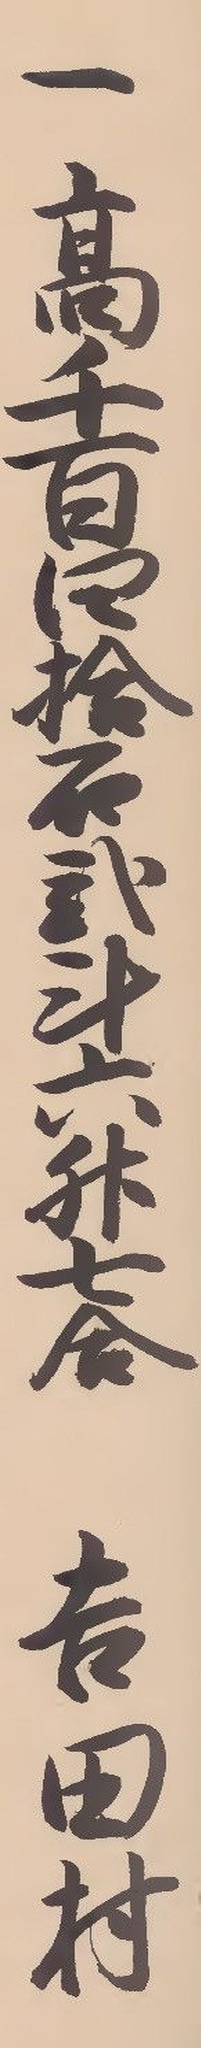一高千百四拾石弐斗六升七合吉田村
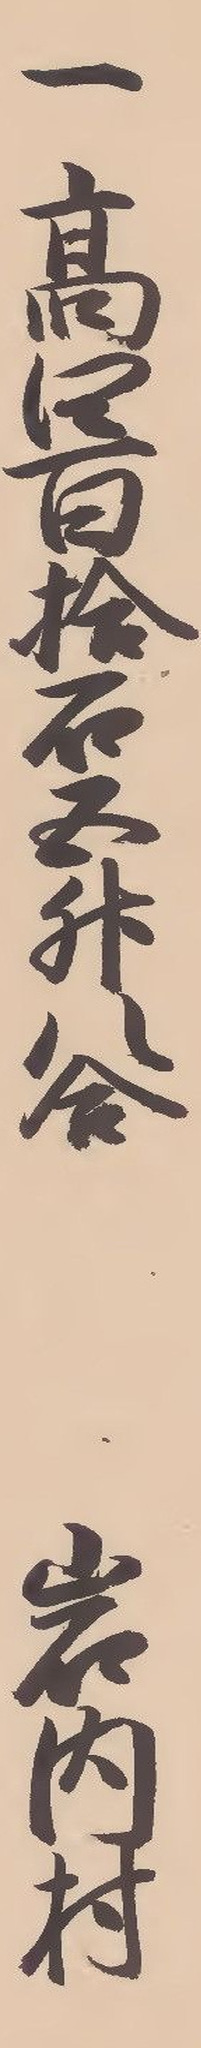一高四百拾石五升八合岩内村
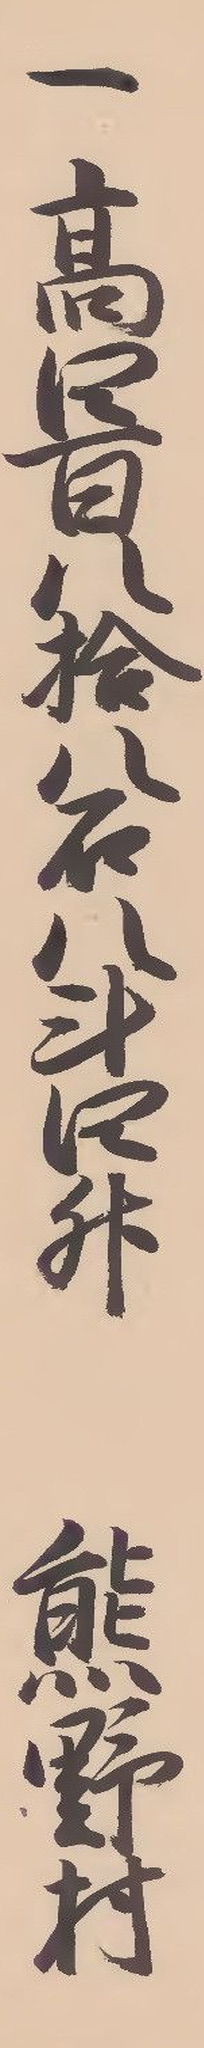一高四百八拾八石八斗四升熊野村

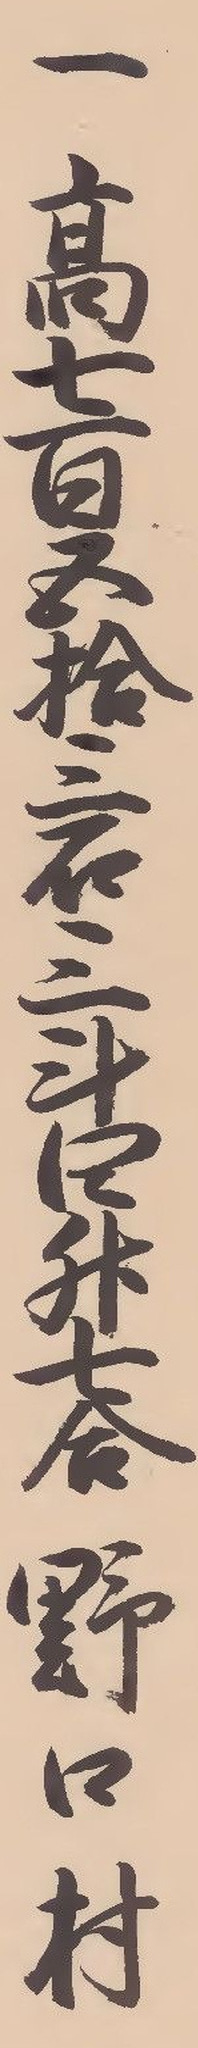一高七百五拾三石三斗四升七合野口村
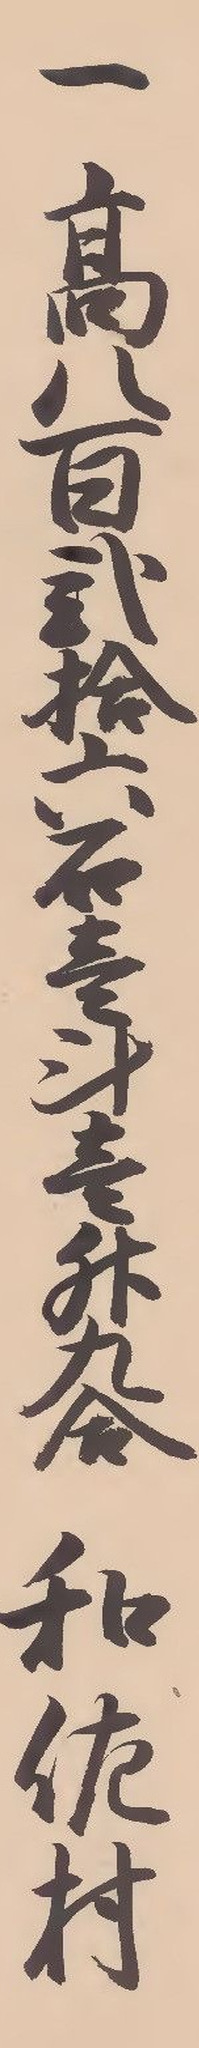一高八百弐拾六石壱斗壱升九合和佐村
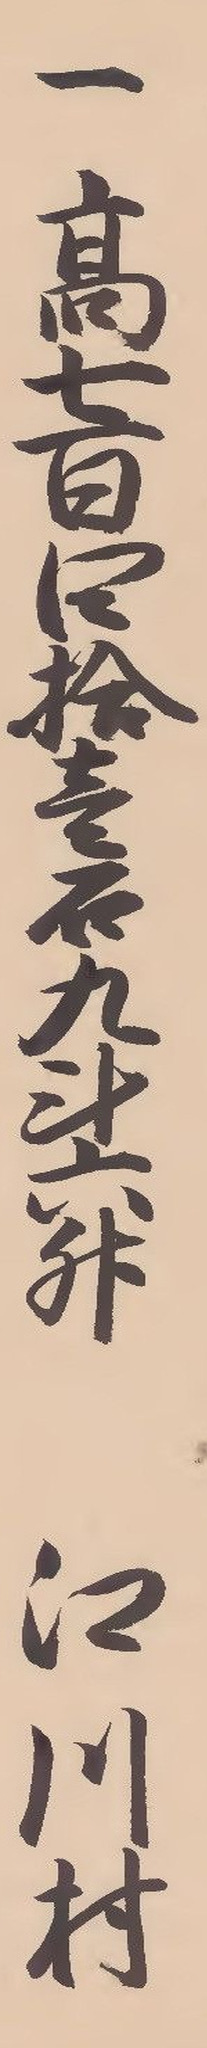一高七百四拾壱石九斗六升江川村
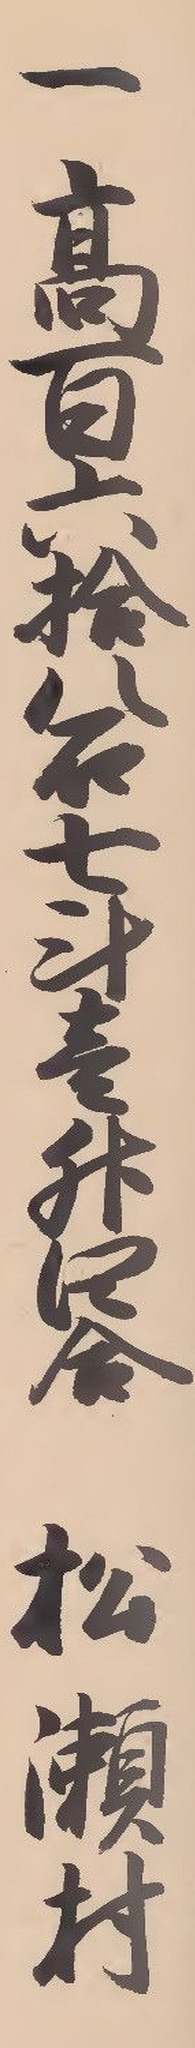一高百六拾八石七斗壱升四合松瀬村
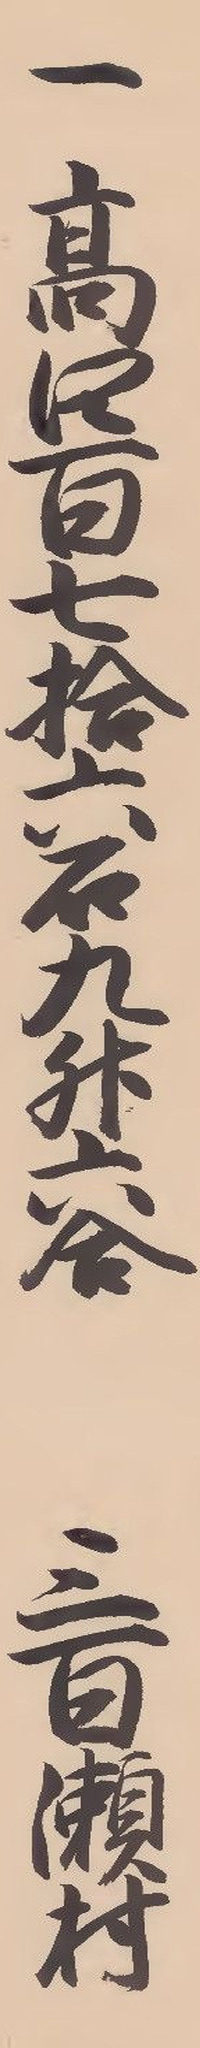一高四百七拾六石九升六合三百瀬村
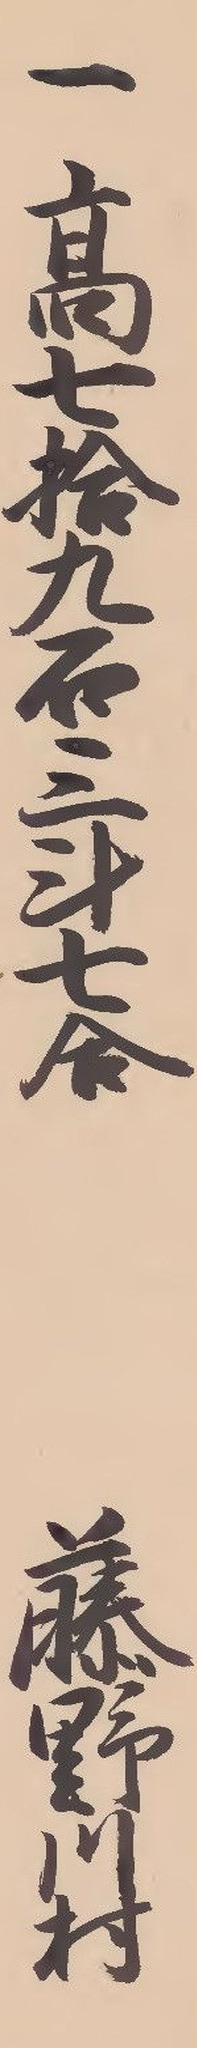一高七拾九石三斗七合藤野川村
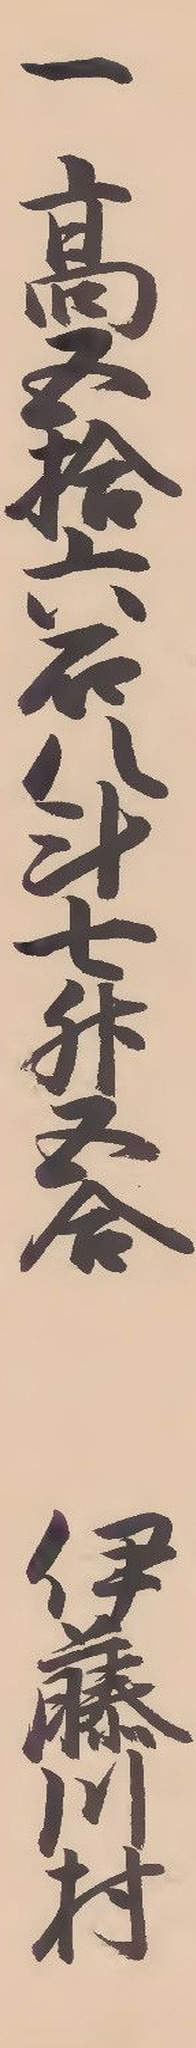一高五拾六石八斗七升五合伊藤川村

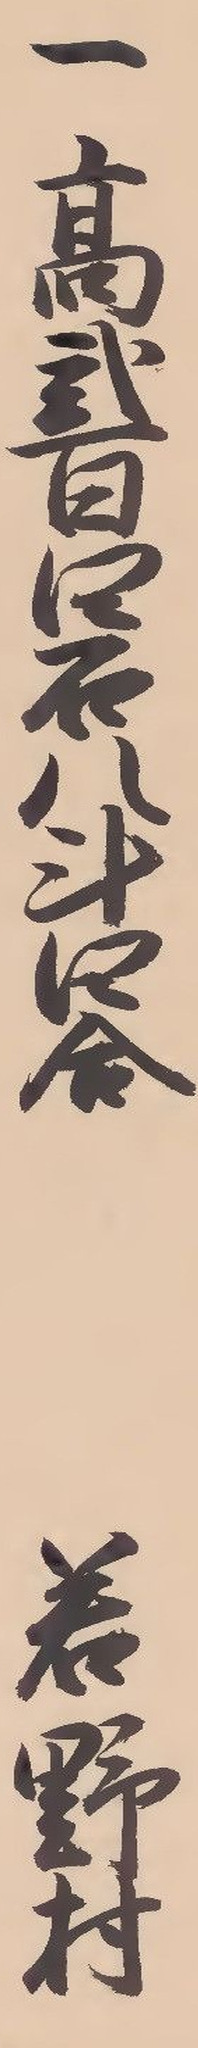一高弐百四石八斗四合若野村
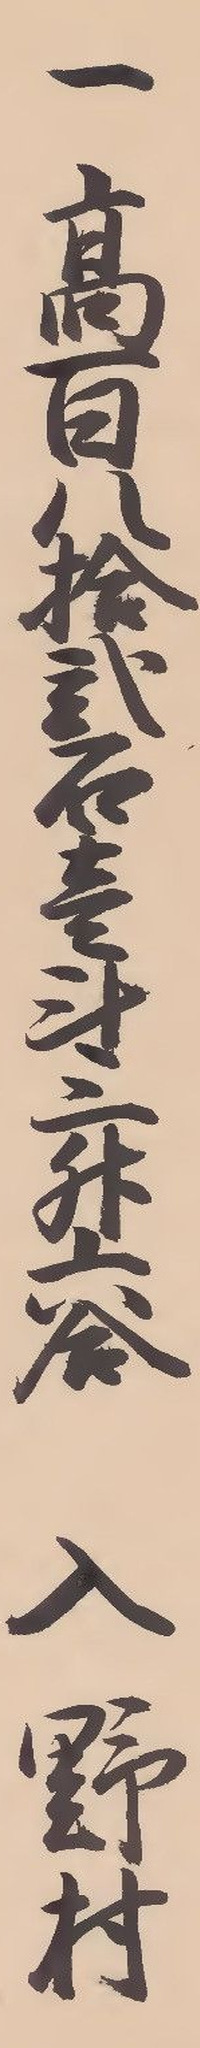一高百八拾弐石壱斗三升六合入野村
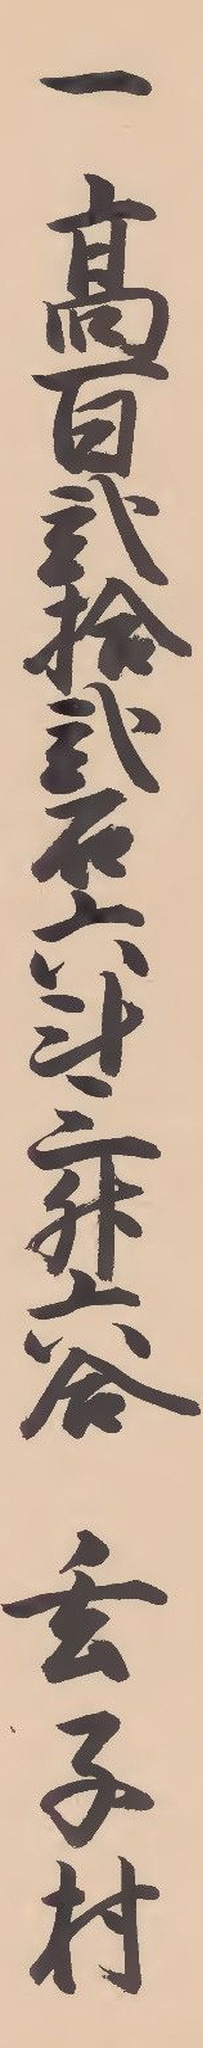一高百弐拾弐石六斗三升六合玄子村
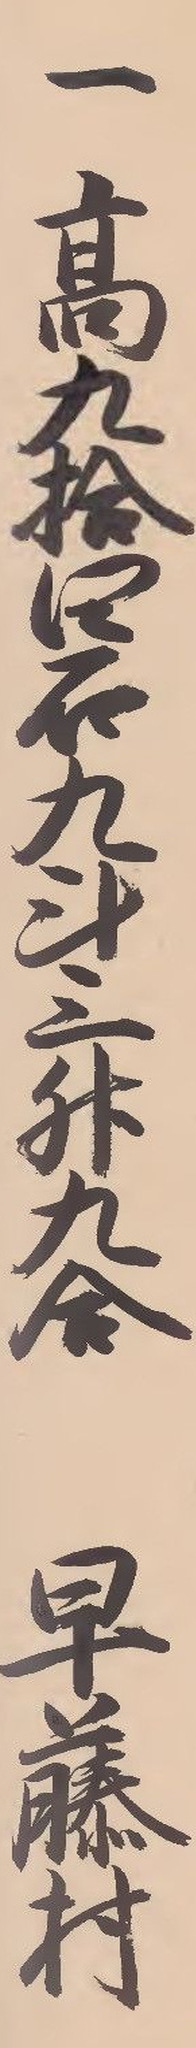一高九拾四石九斗三升九合早藤村
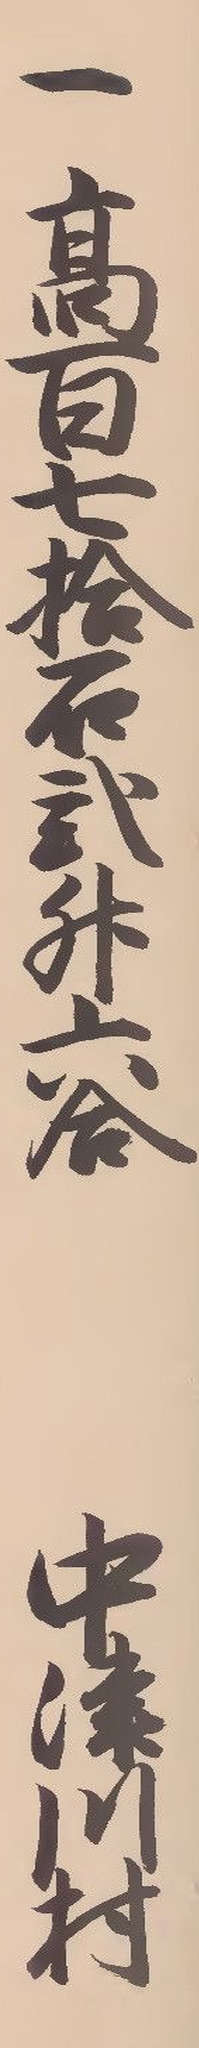一高百七拾石弐升六合中津川村
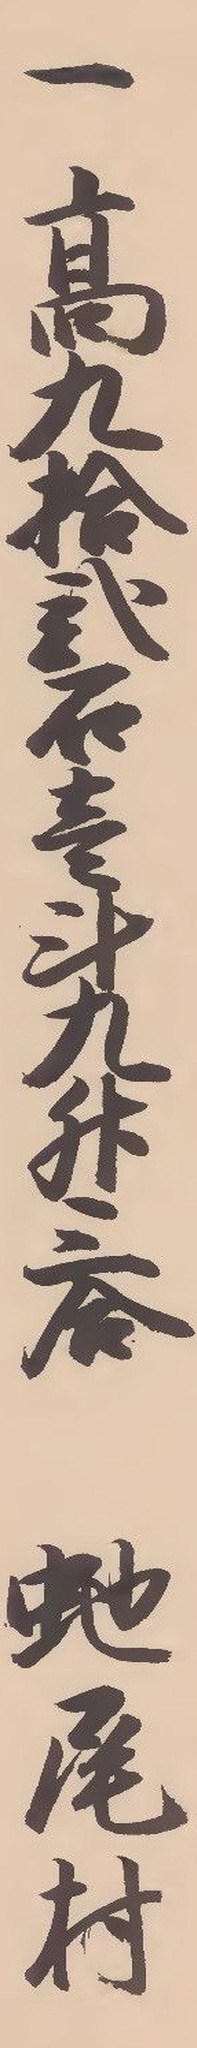一高九拾弐石壱斗九升三合蛇尾村
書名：紀伊国郷帳
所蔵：国立公文書館 National Archives of Japan
